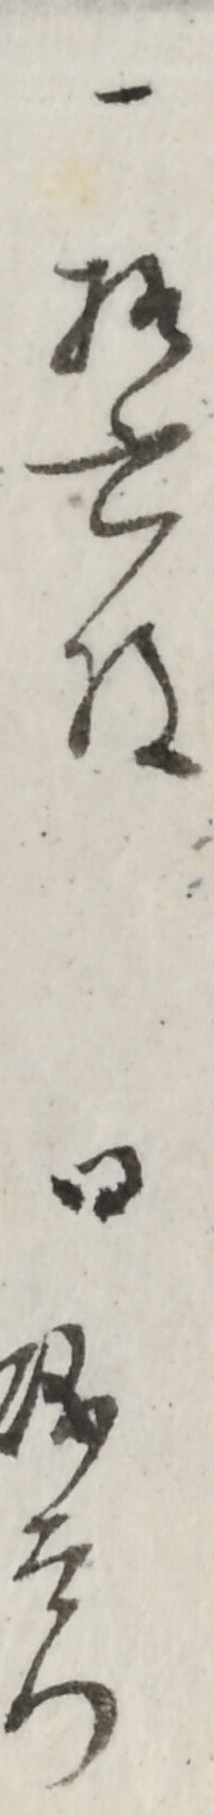一拾六枚磯右衛門

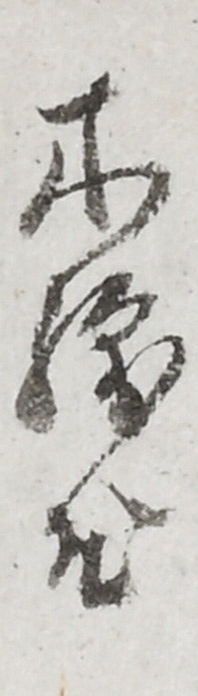木綿屋
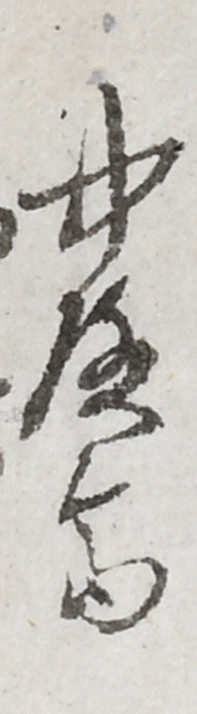中殿島
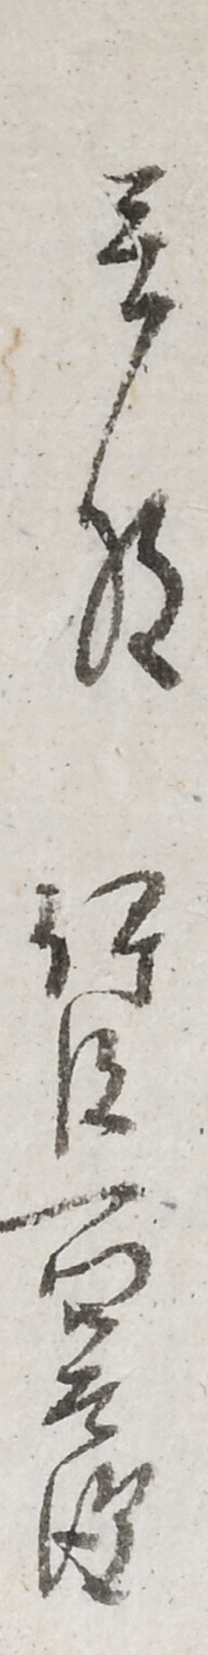一壱枚伊藤百兵様
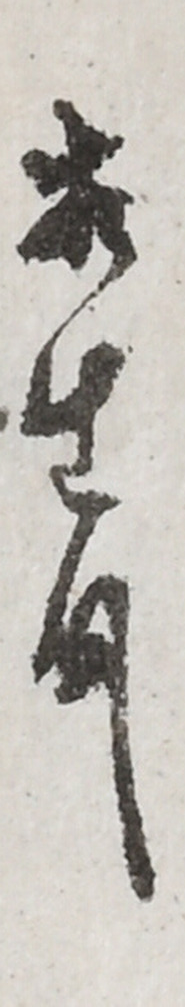相生町
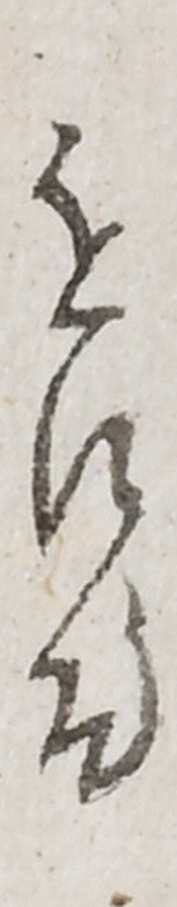近江屋
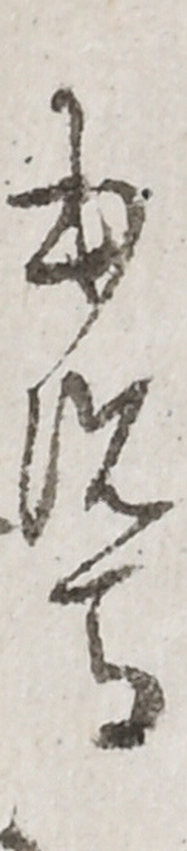本洗馬
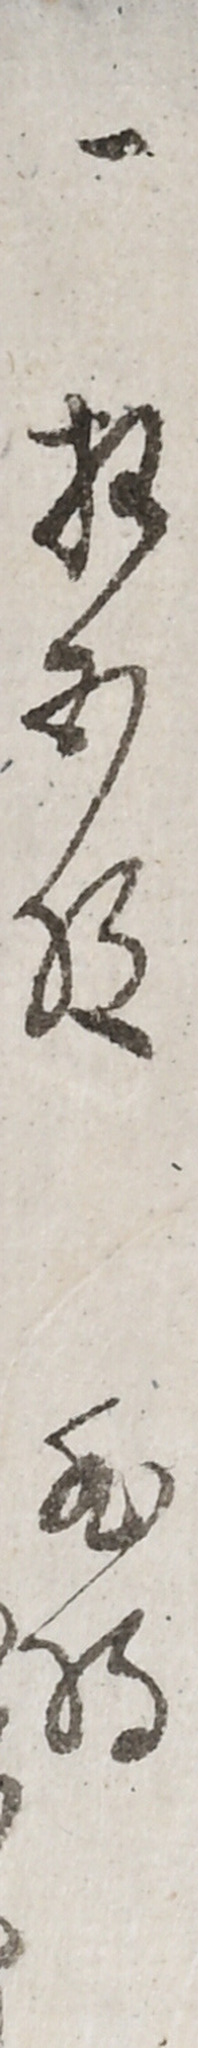一拾五枚繁十
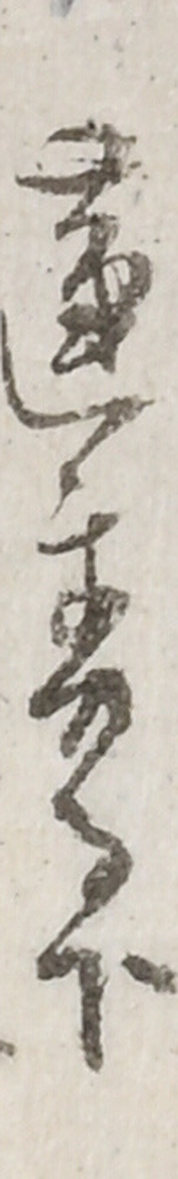蓮春寺下
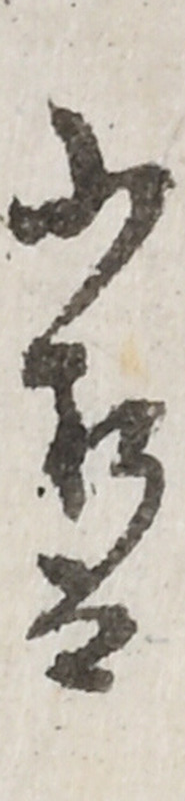小松屋
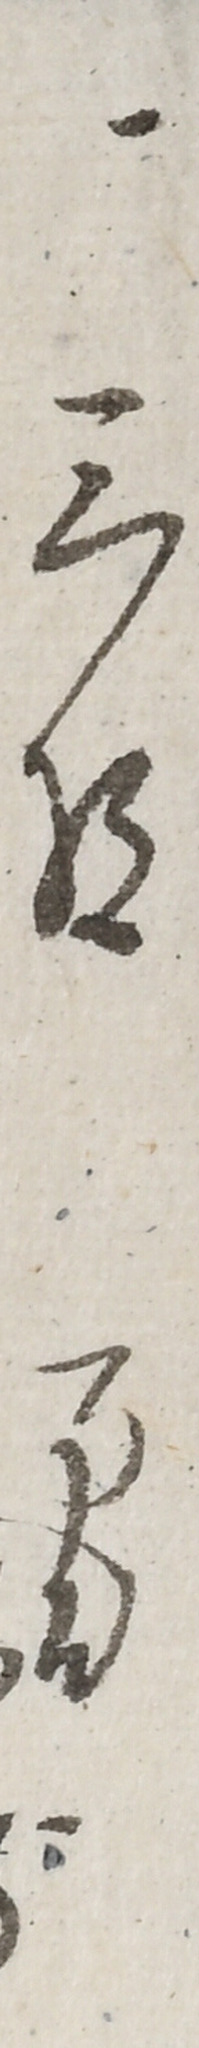一三枚久蔵
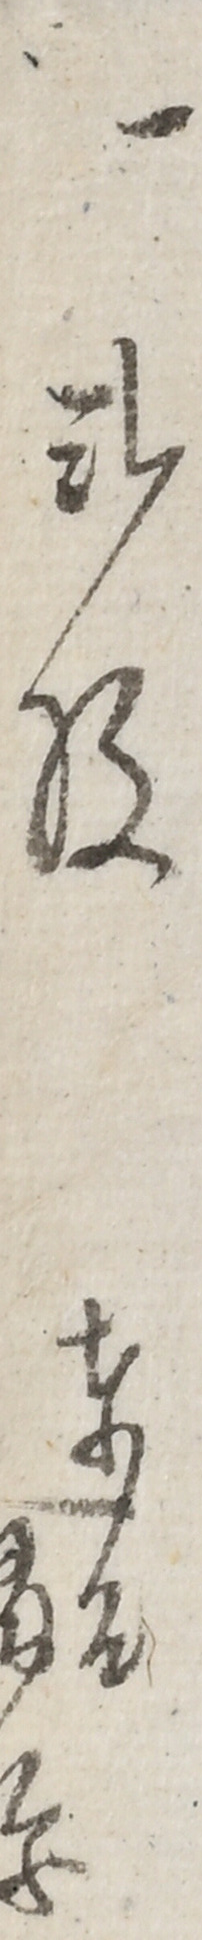一弐枚浦弥
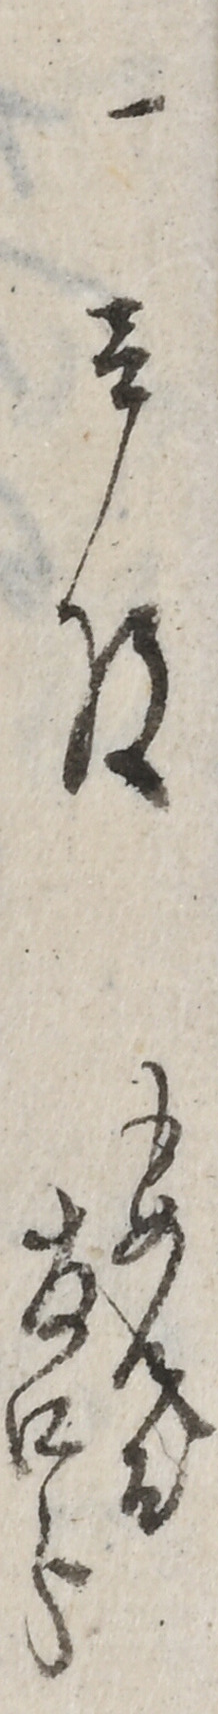一壱枚二三郎
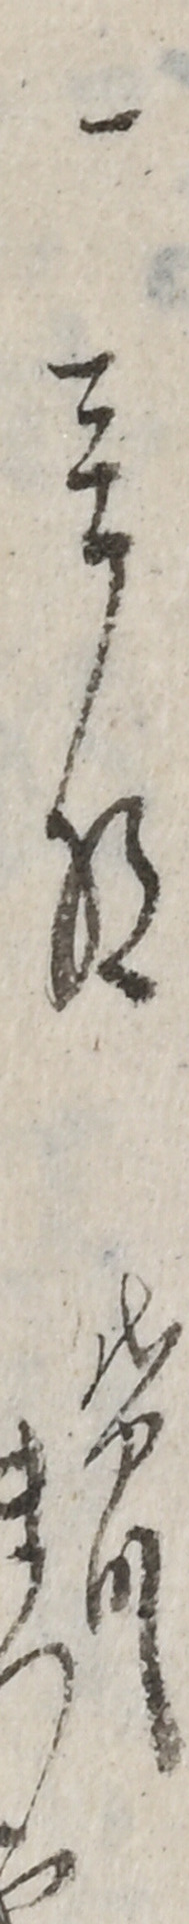一壱枚太蔵
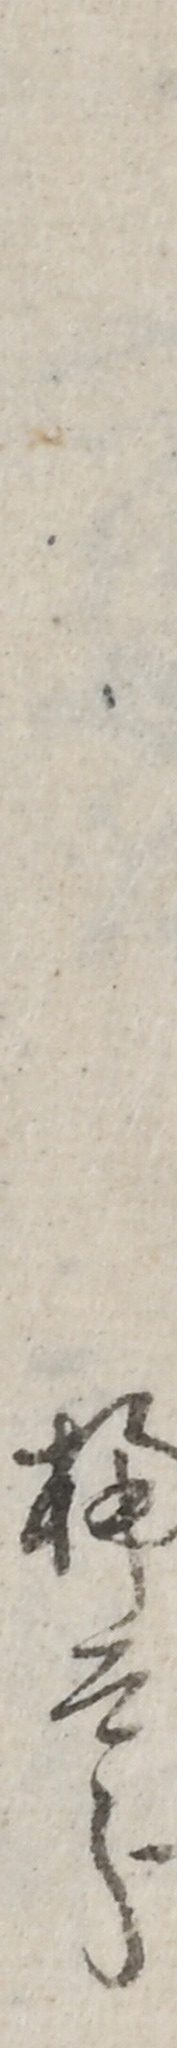常太郎
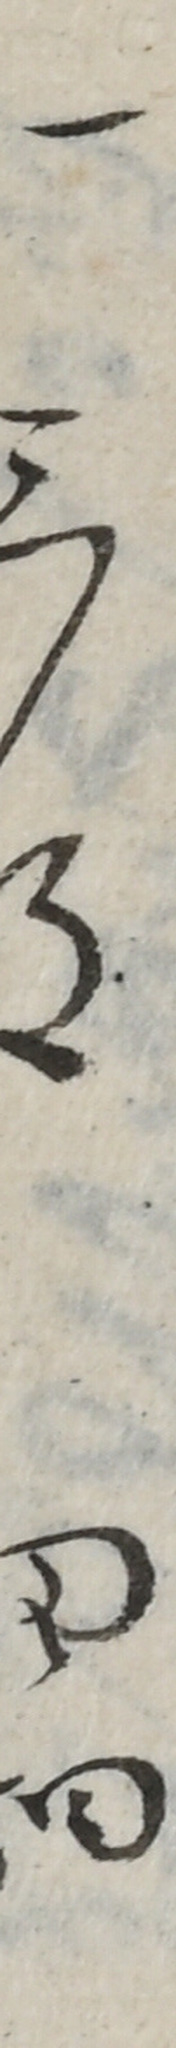一三枚久蔵
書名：髙遠限楮幣引換覚帳
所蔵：伊那市立高遠町図書館・合同会社AMANE
